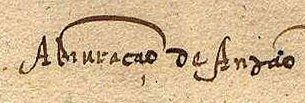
Abiuração de Antão
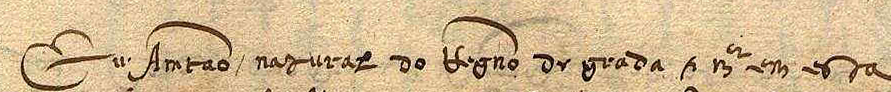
Eu Amtão / natural do Regno de grada e mor em esta
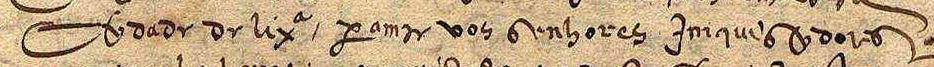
Cydade de lixa / ꝑamte vos senhores Jmquisydores
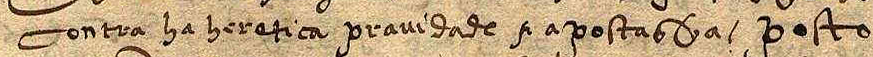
Contra ha heretica prauidade e apostasya / posto
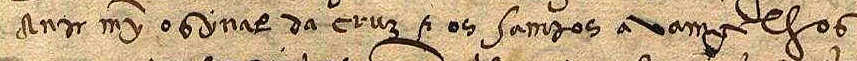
Ante mȳ o synal da cruz e os Samtos avamgelhos
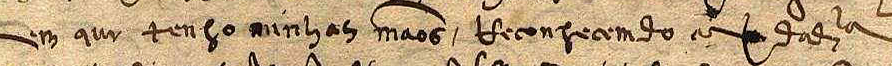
em que tenho minhas mãos / Reconhecemdo a ꝟdadira
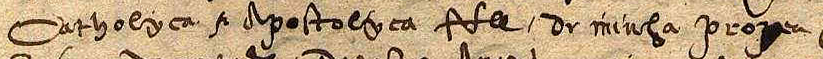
Catholyca e Apostolyca ffee / de minha propea e
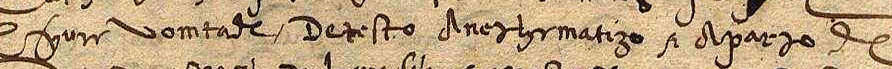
lyure vomtade / Detesto Anethematizo e Aparto de
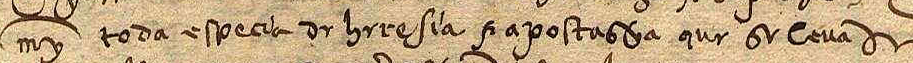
m̄y toda especia de heresia e apostasya que se leuāte
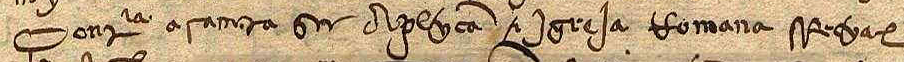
Contra a samta see Aplyc̄a e JgreJa Romana specyaL
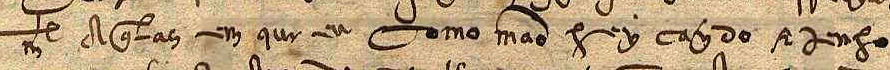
mte Aq̄Las em que eu Como mão hey caydo e tenho
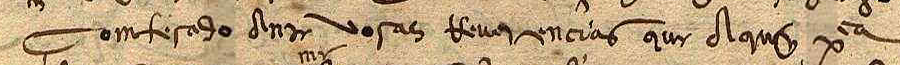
Comfesado Ante vosas Reuerencias que Aquy pca
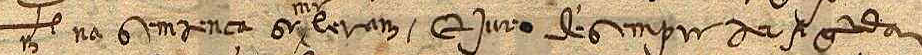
mte na semtença se me leram / E Juro de sempre ter e ḡrdar
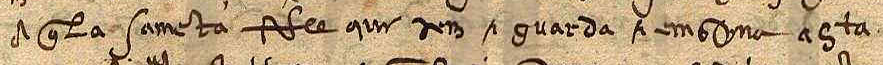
Aq̄la Samcta ffee que tem e guarda e emsyna a Sta
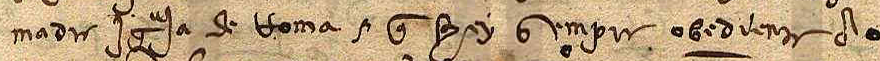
madre JḡJa de Roma e q̄ ꞩey sempre obediente Ao
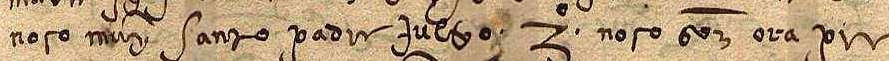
noso muȳ Santo padre Julyo. 3º. noso s̄or ora pre
